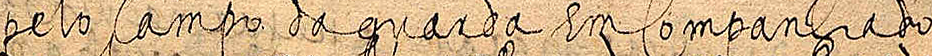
pelo Campo da guarda Em Companhia do
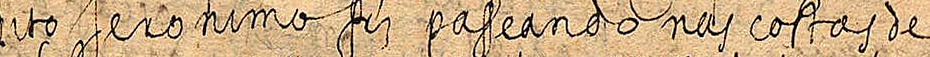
dito Jeronimo frz̄ passeando nas costas de
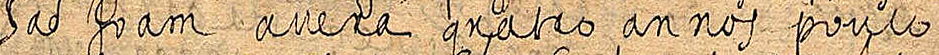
Saõ Joam auera quatro annos pouco
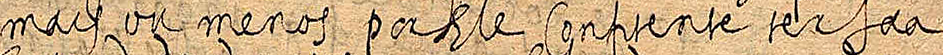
mais ou menos por Ele Confitente ter Jaa
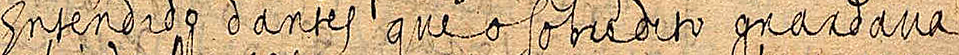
Entendido dantes que o sobredito guardaua
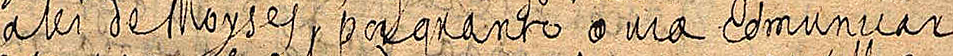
a lei de Moyses porquanto o uia cōmunicar
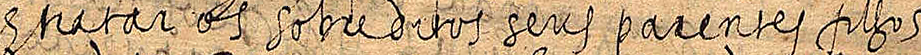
E tratar os sobreditos seus parentes filhos
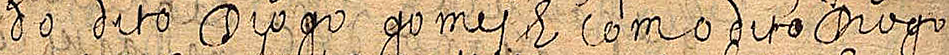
do dito Diogo gomes E com o dito Diogo
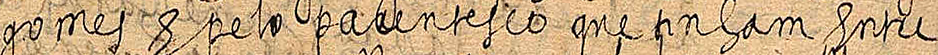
gomes E pelo parentesco que tinham Entre
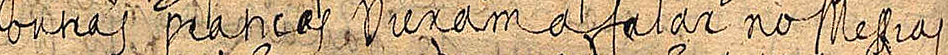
outras praticas Vieram a falar no Messias
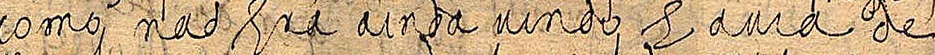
como naõ Era ainda uindo E auia de
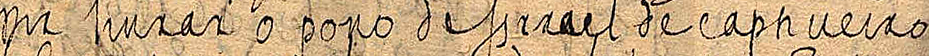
vir liurar o pouo de Jsrael de captiueiro
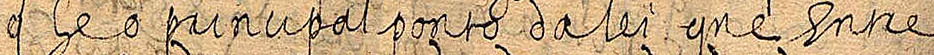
q̄ he o principal ponto da lei que Entre
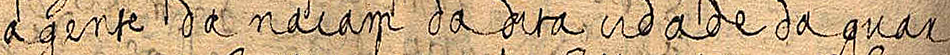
a gente da nacam da dita cidade da guar
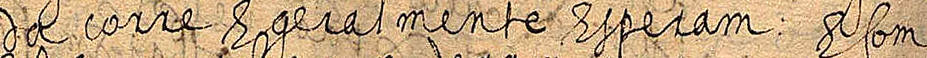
da corre E geralmente Esperam: E Com
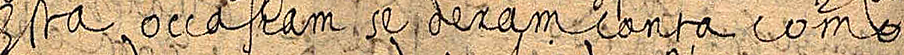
Esta occasiam se deram conta como
